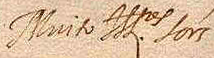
Muito Il̄l.res sor̄s
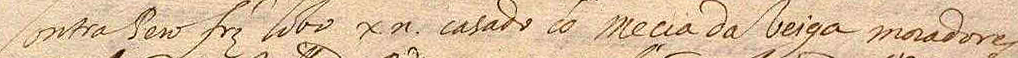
Contra Pero frz̄ lobo x. n. casado cō mecia da veiga moradores
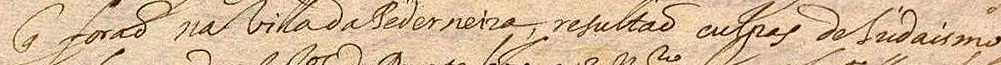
q̄ foraõ na villa da Pederneira, resultaõ culpas de Iudaismo
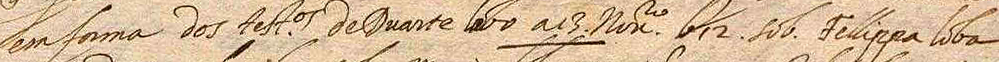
em forma dos test.os de Duarte lobo a 13 Nouro 612 sob. Fellippa loba
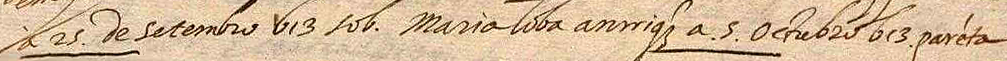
a 25 de setembro 613 sob. maria loba anrriq̄z a 5 octubro 613 parēta
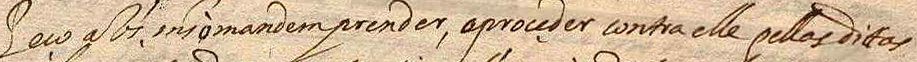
Peço a vs̄ ms̄ o mandem prender, e proceder contra elle pellas dittas
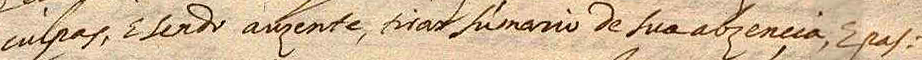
culpas, E sendo auzente, tirar sūmario de sua abzencia, E pas
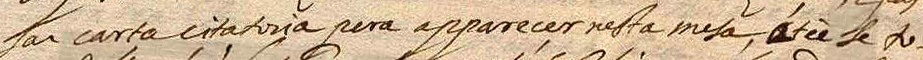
sar carta citatoria pera apparecer nesta mesa, ateé se to
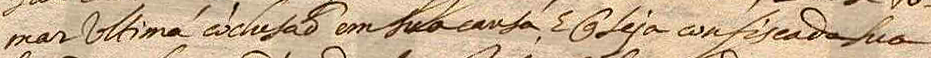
mar vltima cōclusaõ em sua causa, E q̄ seja confiscada sua
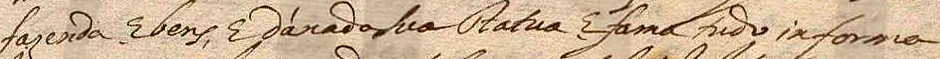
fazenda E bens, E dānada sua statua, E fama tudo in forma
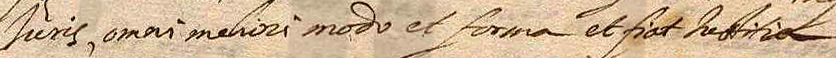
Juris, omni meliori modo et forma et fiat Iustitia
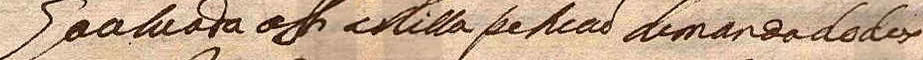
E a aluada assi a ditta petiçaõ de mandado dos
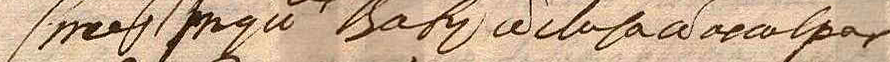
snres̄ Jnqures lha fiz cōclusa cō as culpas
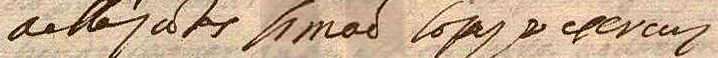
a ella jūtas Simaõ lopez o escreuj
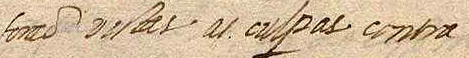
foraõ uistas as culpas contra
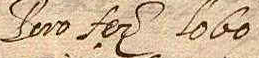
Pero frz̄ lobō
